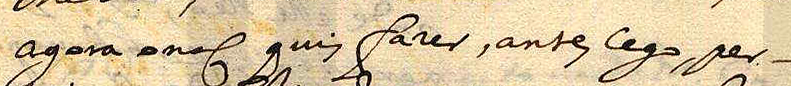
agora o naꝭ quis fazer, antes cego, per
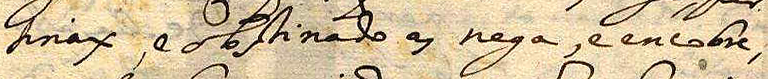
tinax, e obstinado as nega, e encobre,
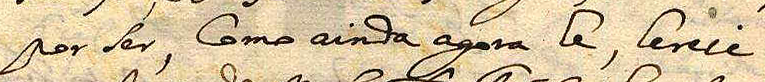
por ser, Como ainda agora he, hereie
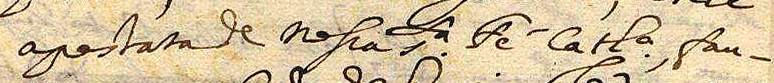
apostata de nossa sta. Fé Catha., fau
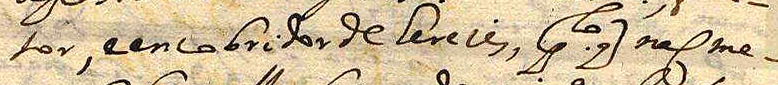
tor, e encobridor de hereies, plo. q̄ naꝭ me
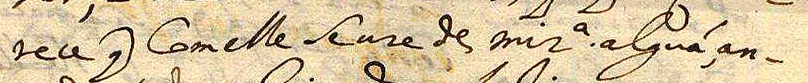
rece q̄ Com elle se uze de miza. alguā, an
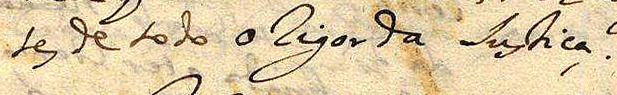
tes de todo o Rigor da Iustiça.
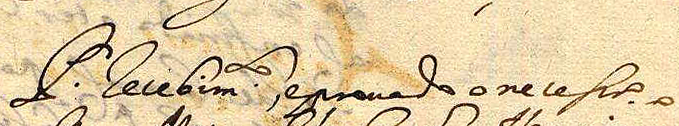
P. Recebim.to, e prouado o necessr.o o
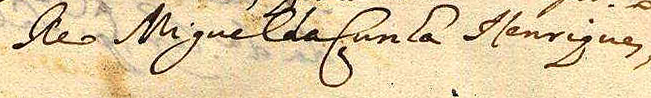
Reo Miguel da Cunha Henriques,
